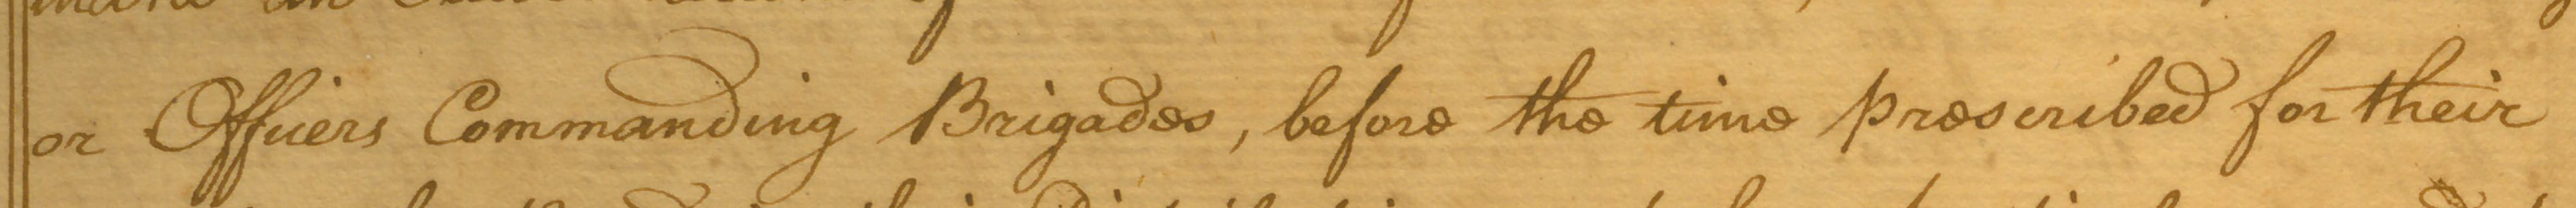or Officers Commanding Brigades, before the time prescribed for their
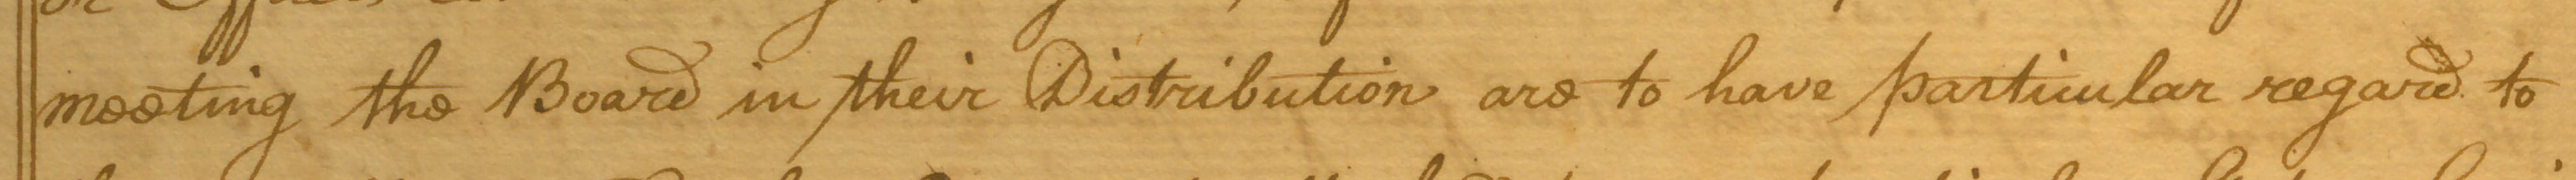meeting the Board in their Distribution are to have particular regard to
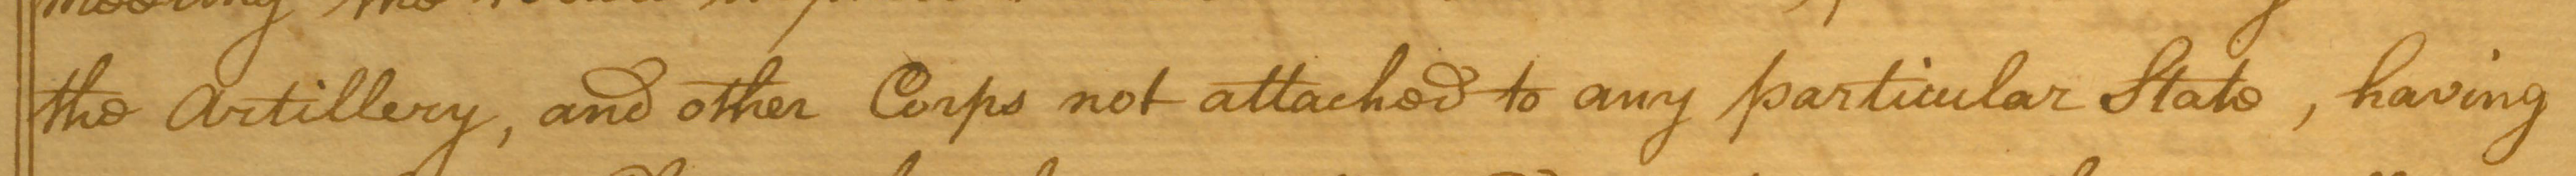the Artillery, and other Corps not attached to any particular State, having
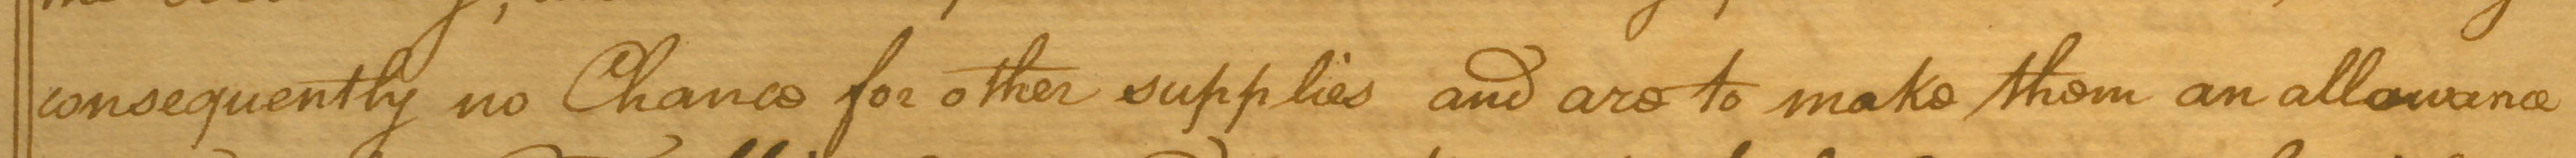consequently no Chance for other supplies and are to make them an allowance
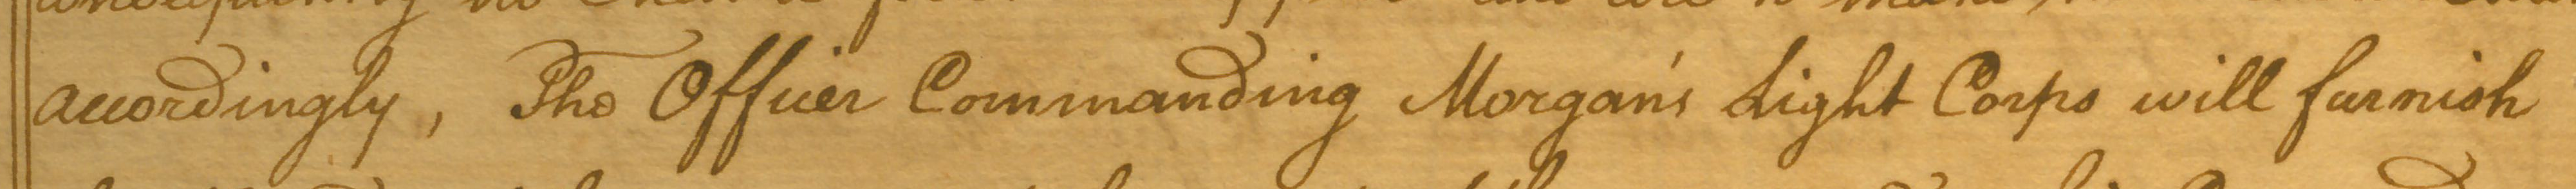accordingly, The Officer Commanding Morgan's Light Corps will furnish
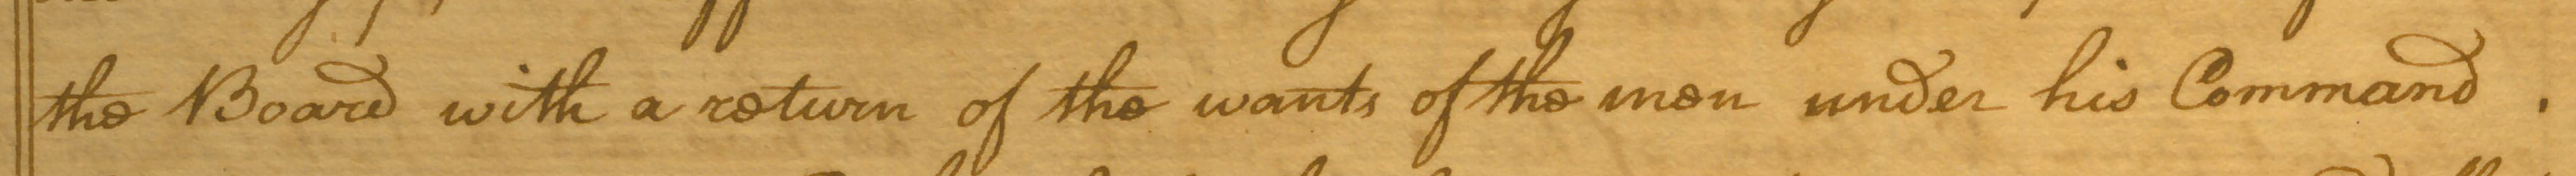the Board with a return of the wants of the men under his Command.
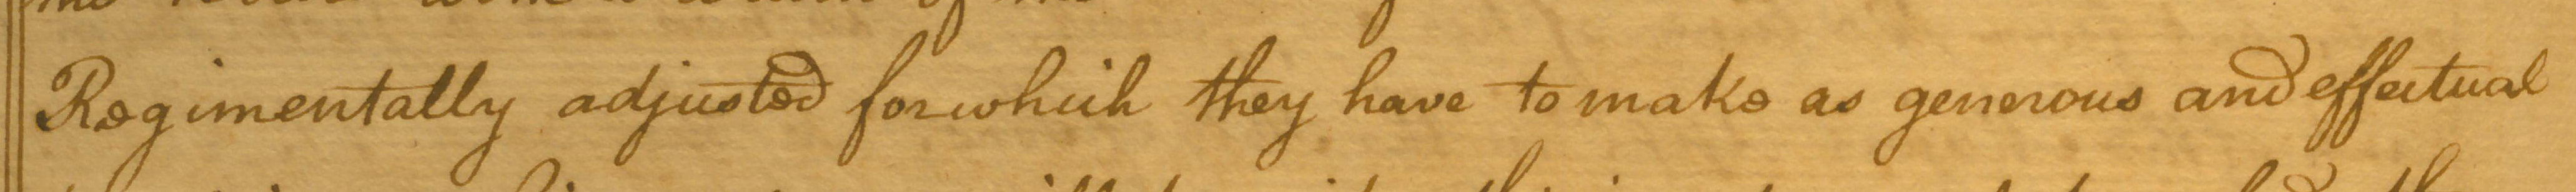Regimentally adjusted for which they have to make a generous and effectual
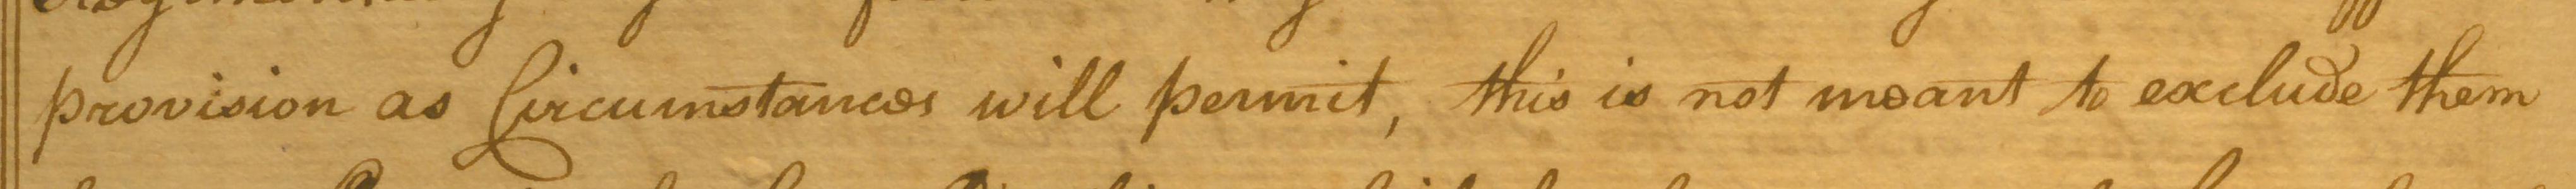provision as Circumstances will permit, this is not meant to exclude them
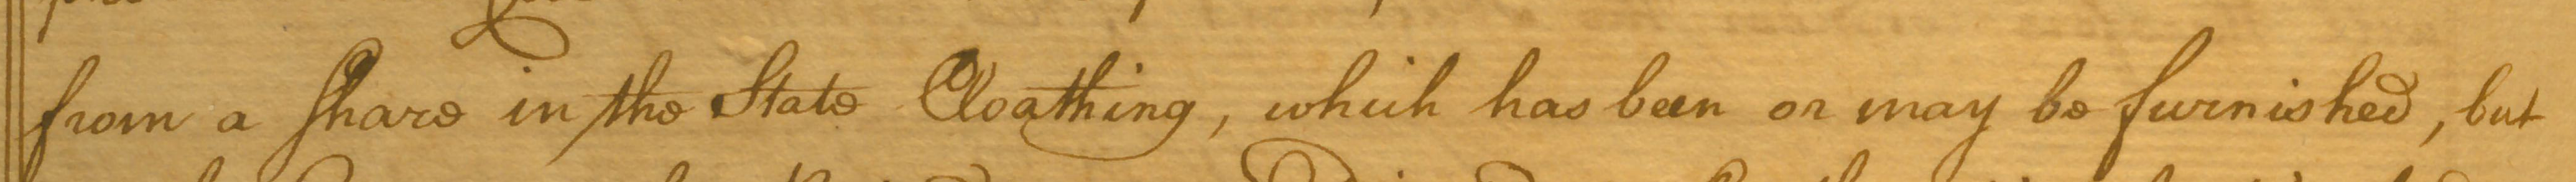from a share in the State Cloathing, which has been or may be furnished, but
